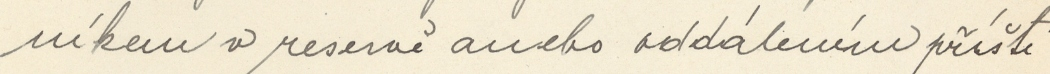níkem v reservě anebo oddálením příští
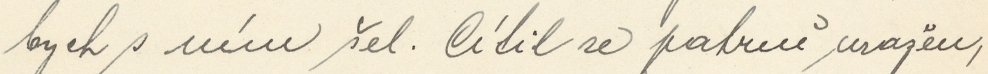bych s ním šel. Cítil se patrně uražen,
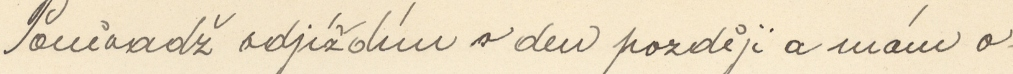Poněvadž odjíždím o den později a mám o-
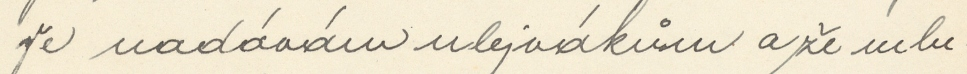že nadávám ulejvákům a že mlu-
